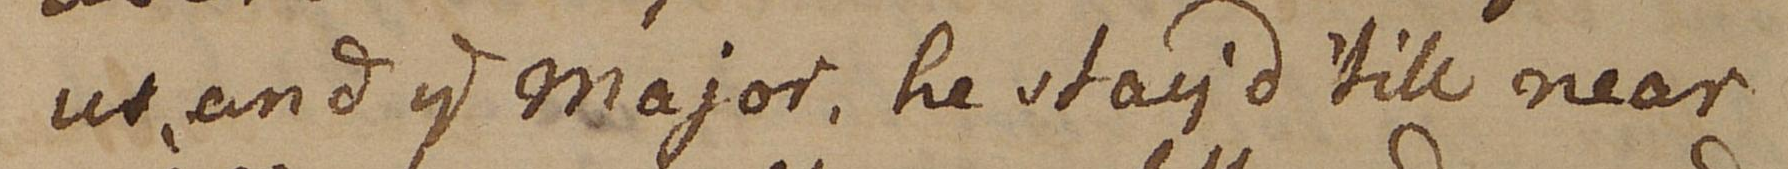us, and y^e Major, he stay'd till near
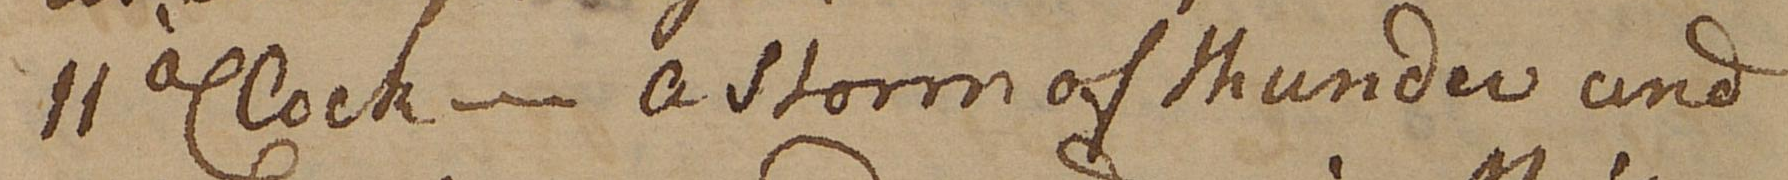11 ^o Clock- a storm of thunder and
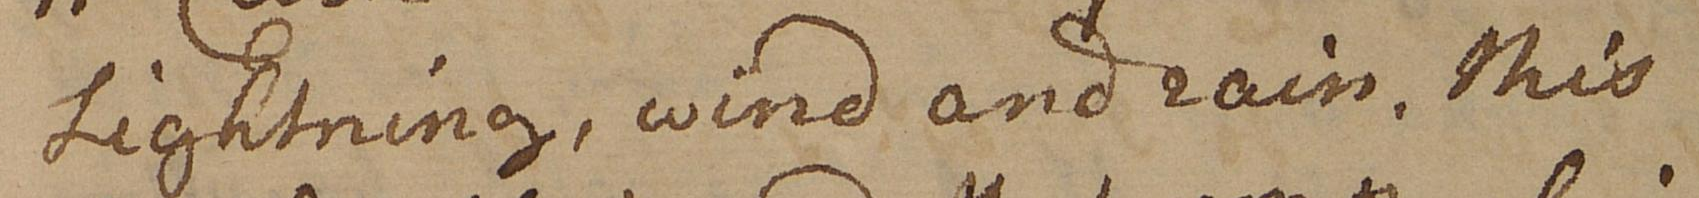Lightning, wind and rain, this
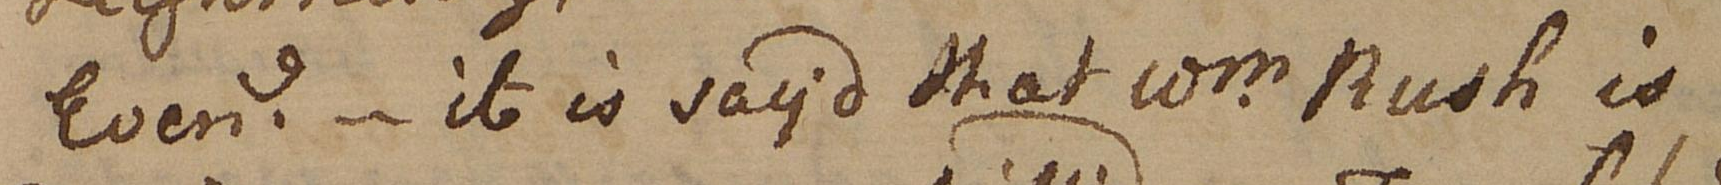Even^g.- it is say'd that W^m. Rush is
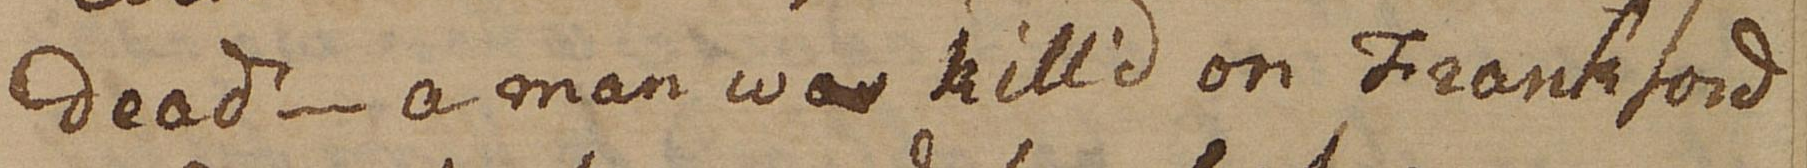dead- a man was kill'd on Frankford
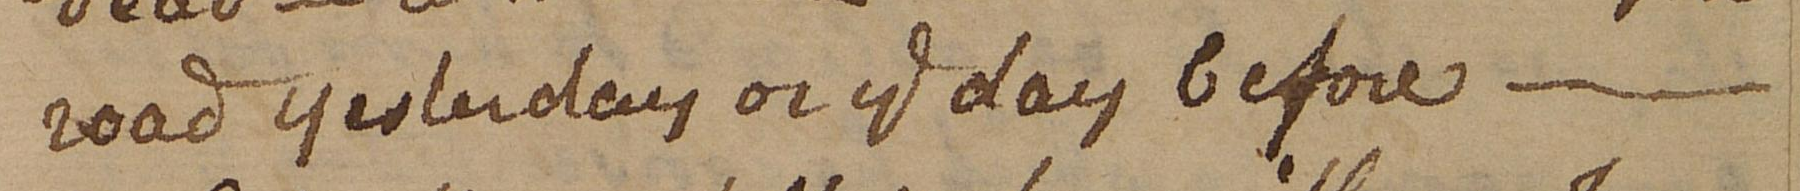road yesterday or y^e day before-
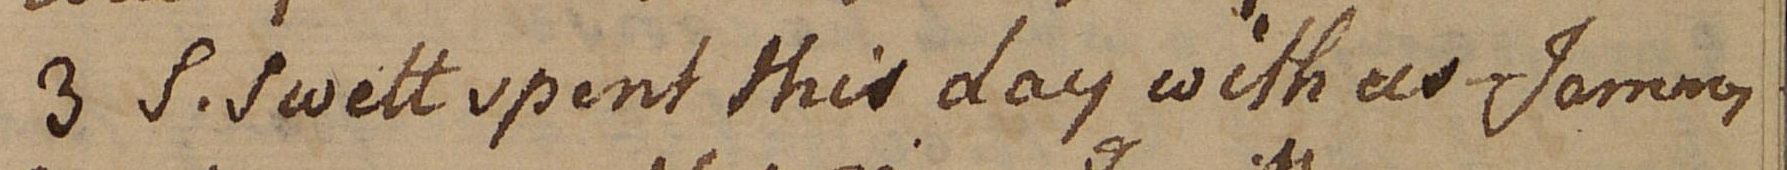3 S. Swett spent this day with us - Jamny
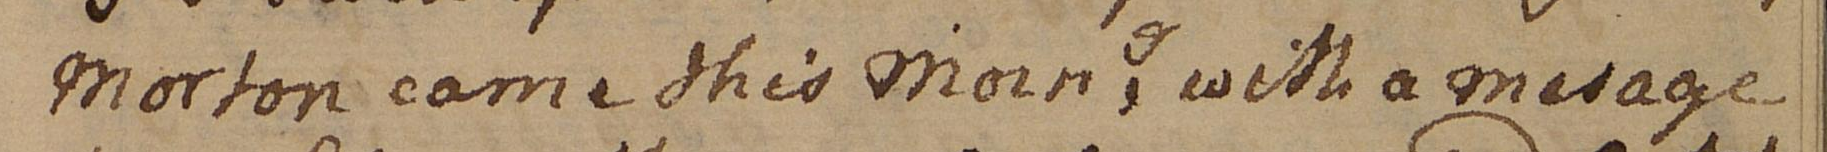Morton came this Morn^g, with a mesage
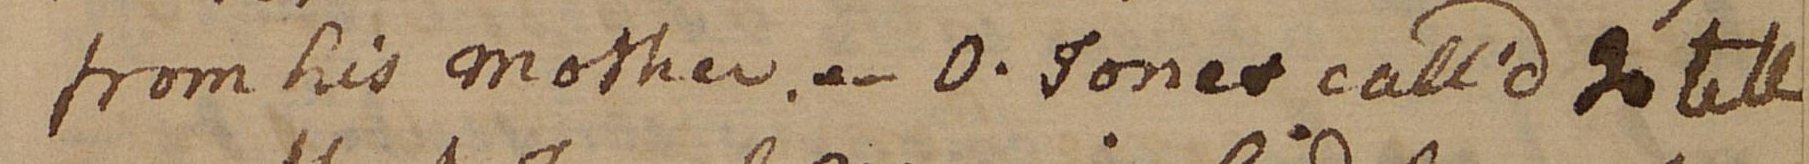from his mother. - O Jones call'd to tell
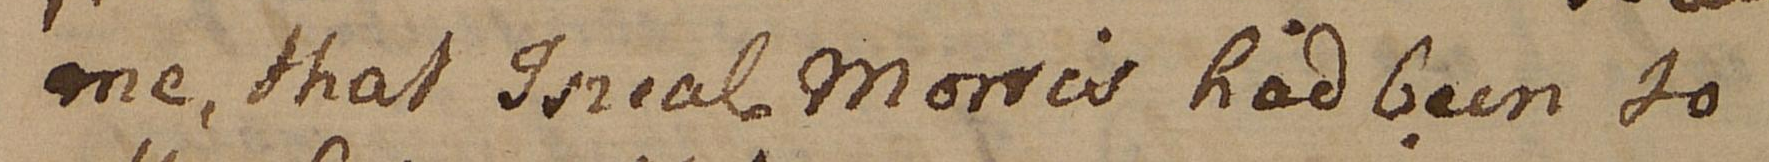me, that Isreal Morris had been to
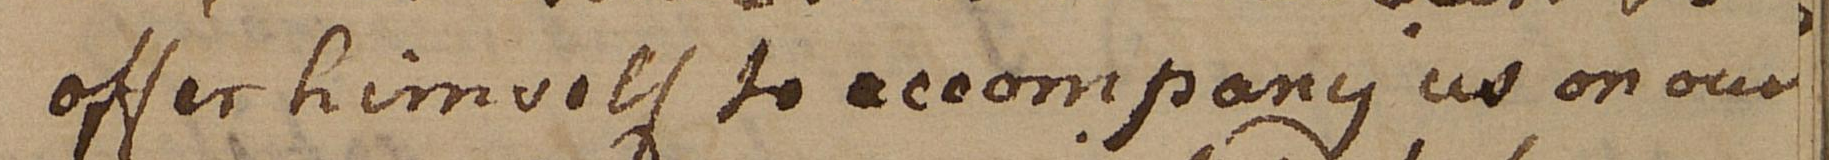offer himself to accompany us on our
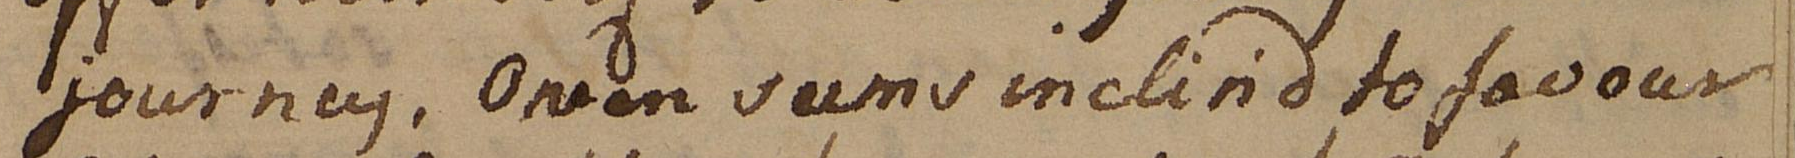journey, Owen seems inclin'd to favour
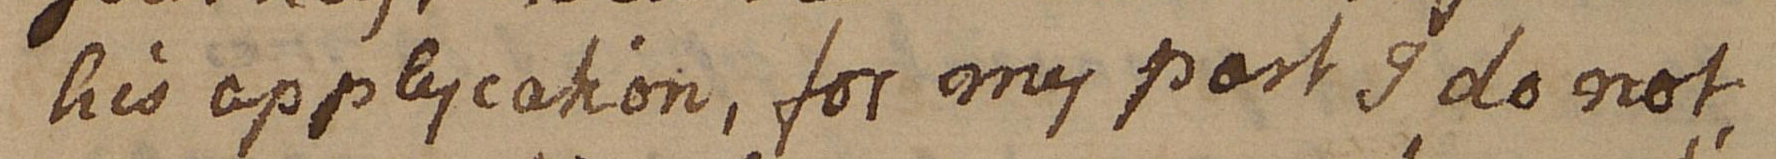his applycation, for my part I do not,
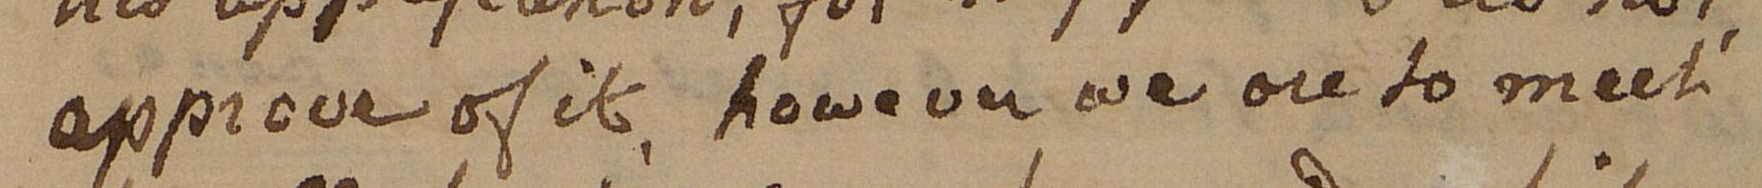approve of it, however we are to meet
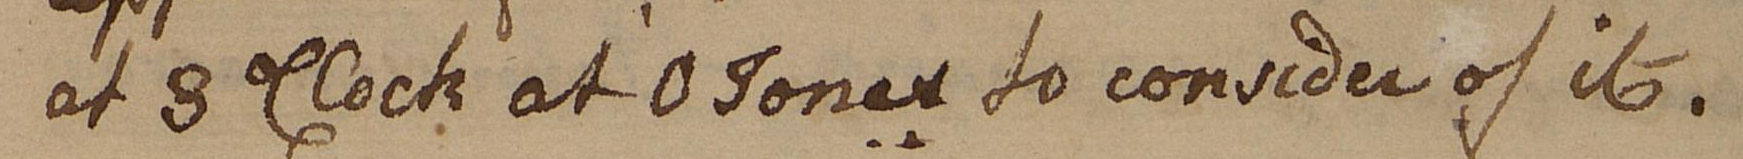at 3 ^o Clock at O Jones to consider of it.
